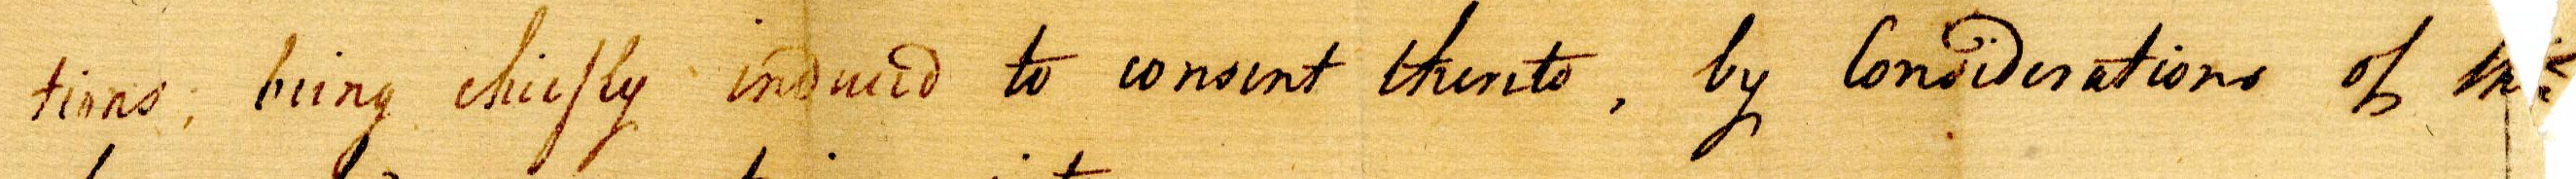-tions, being chiefly induced to consent thereto, by Considerations of this
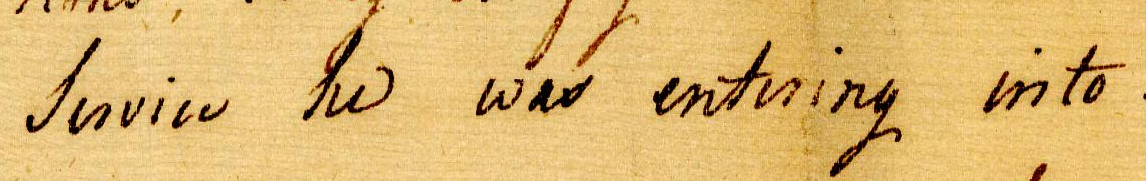Service he was entering into.
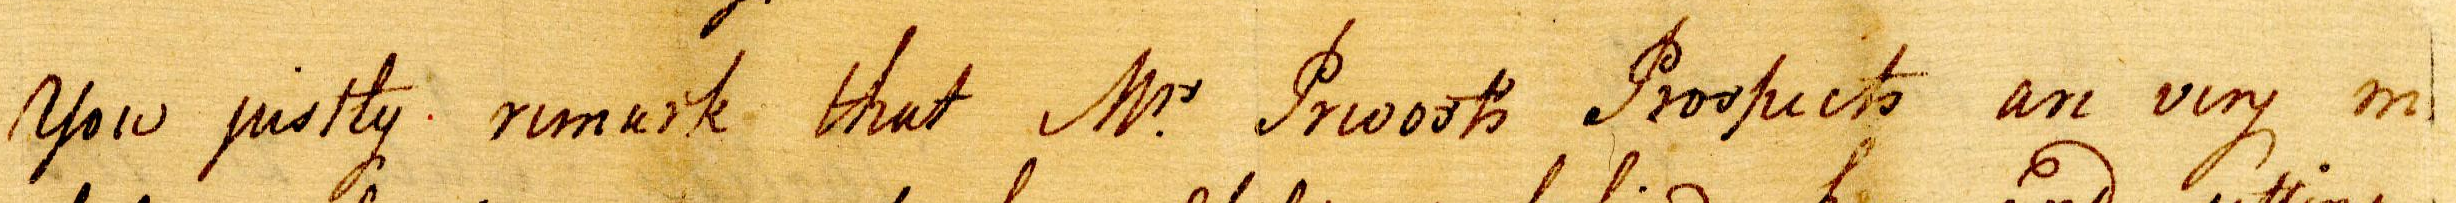You justly remark that M^rs. Prevost Prospects are very m
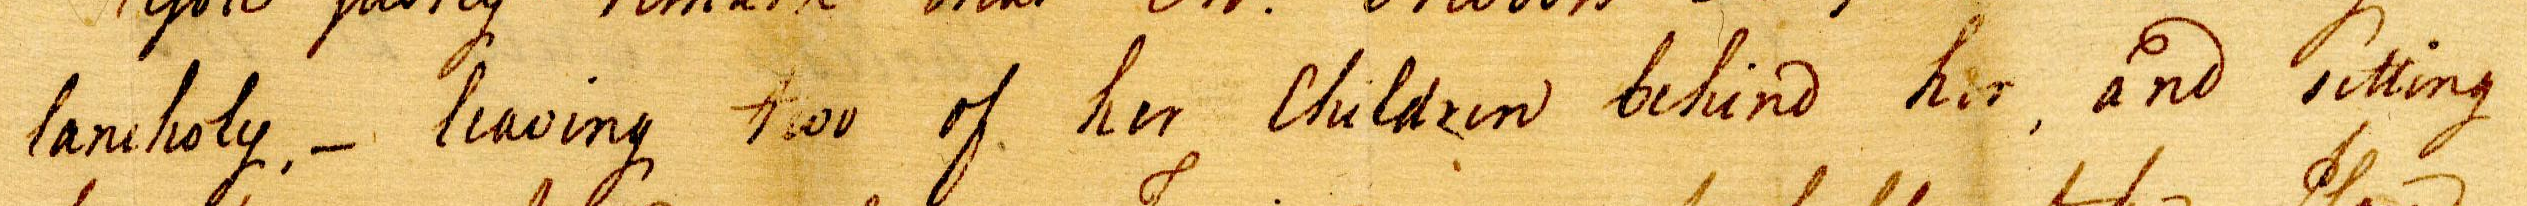lancholy, leaving two of her Children behind her, and setting
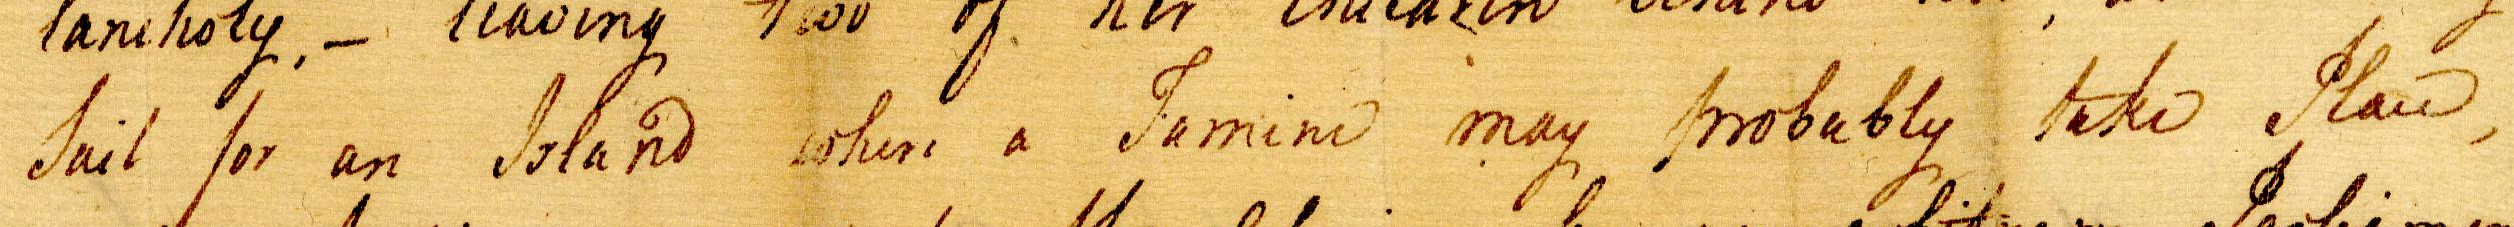Sail for an Island where a Famine may probably take Place
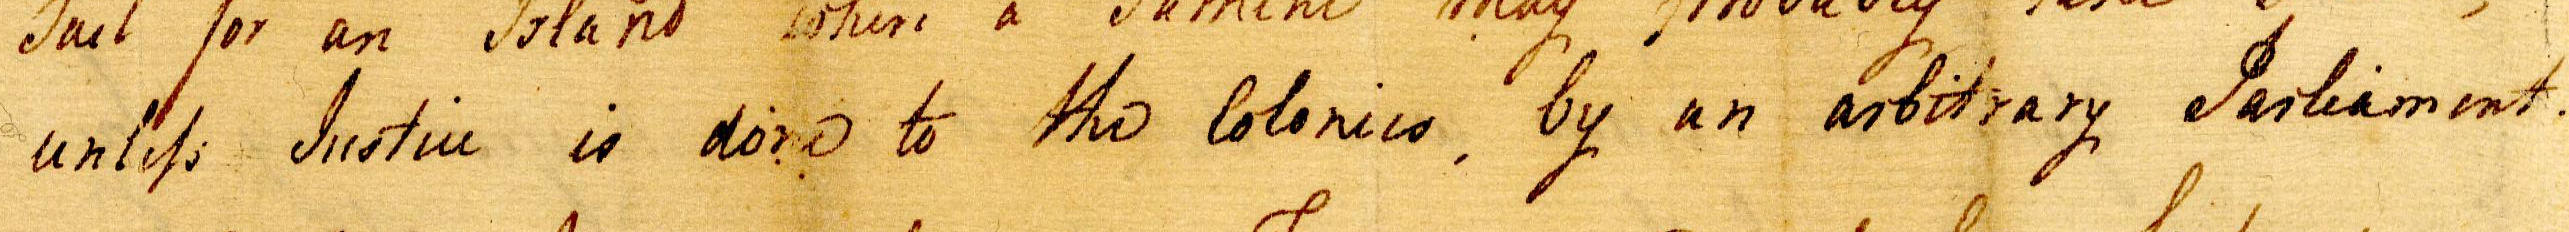unless Justice is done to the Colonies, by an arbitrary Parliament
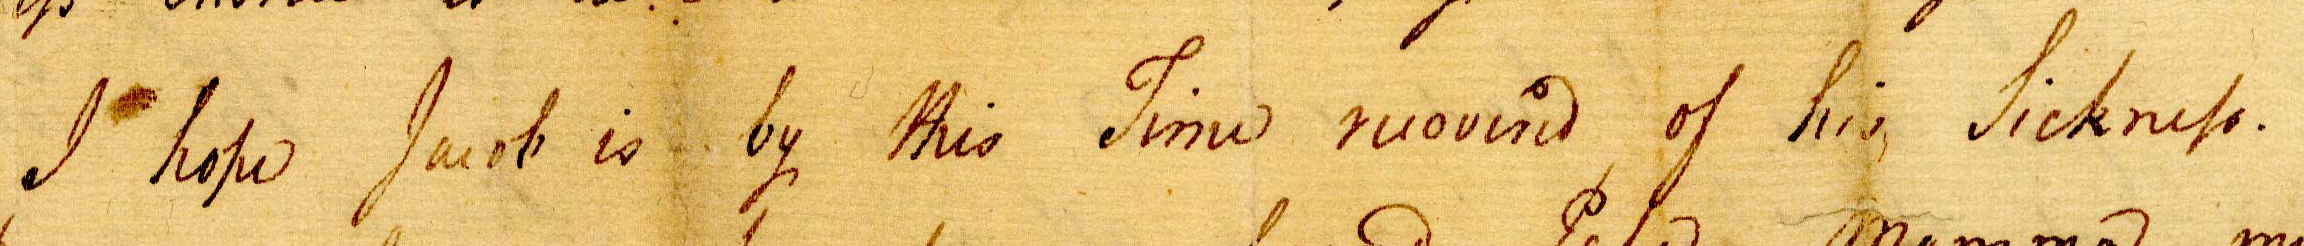I hope Jacob is by this Time recovered of his Sickness
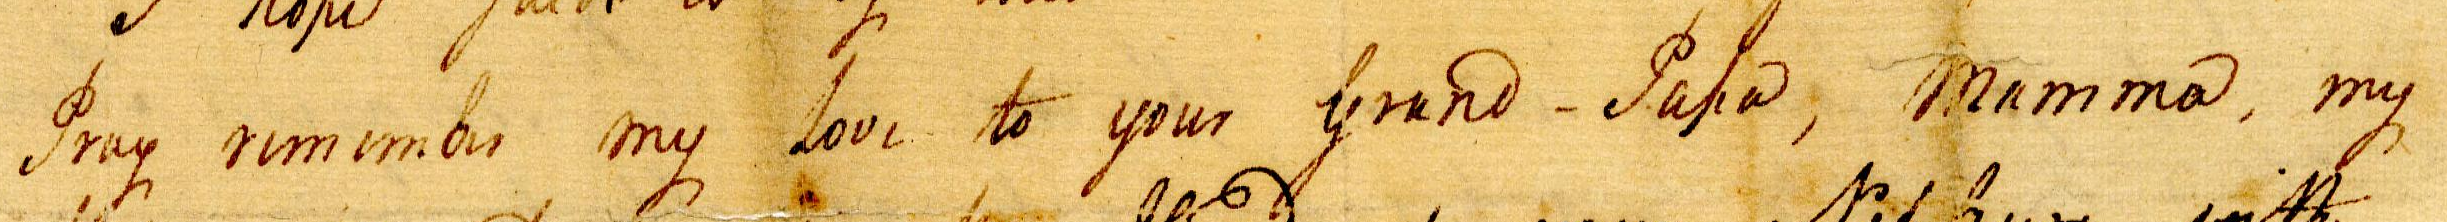Pray remember my Love to your Grand-Papa, Mamma, my
